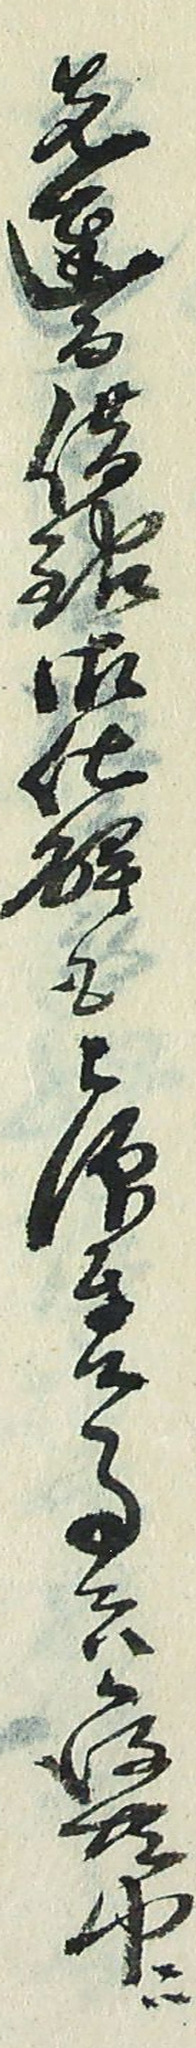先達而借銀御仕解も被仰付候事ニハ候得共中ニハ
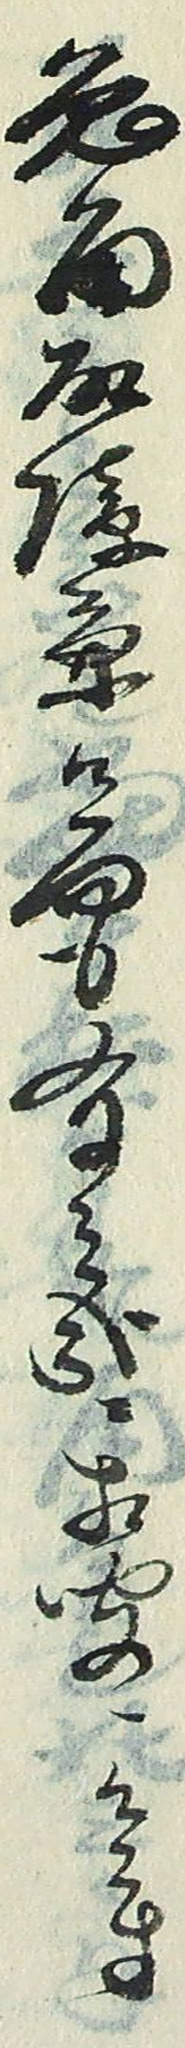兎角取障兼候向も有之哉ニ相聞候ニ付
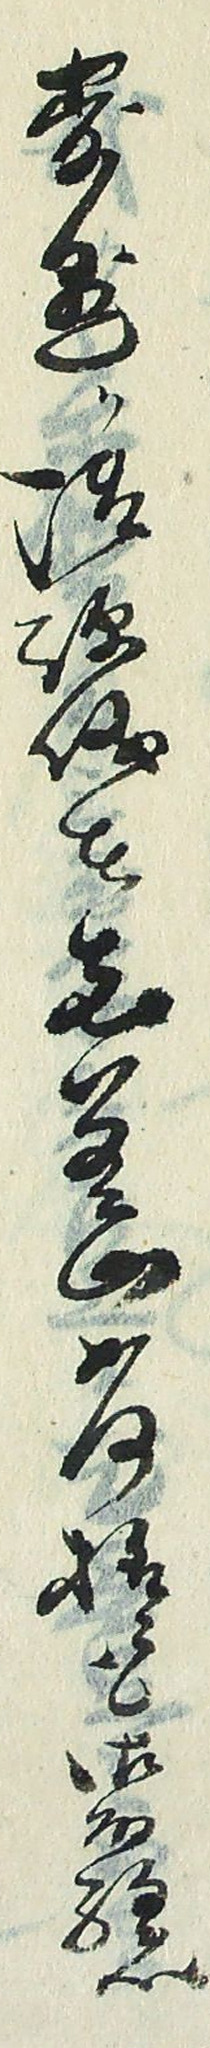歩懸り御評儀者先差止如何様ニも御取約ヲ以
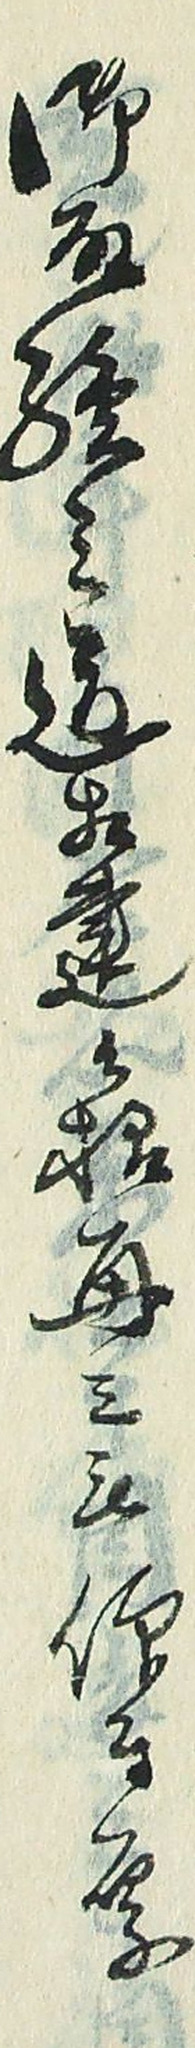御取續之道相建候様再三被仰付厚
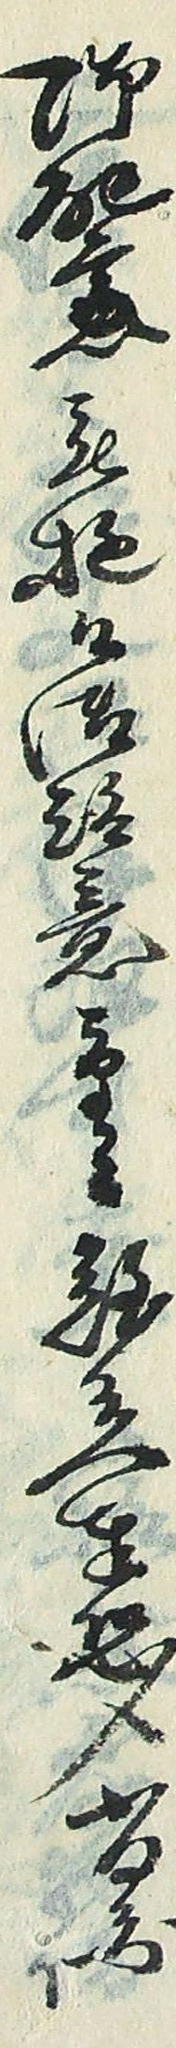御配慮被遊候御趣意重々難有奉恐入尚亦
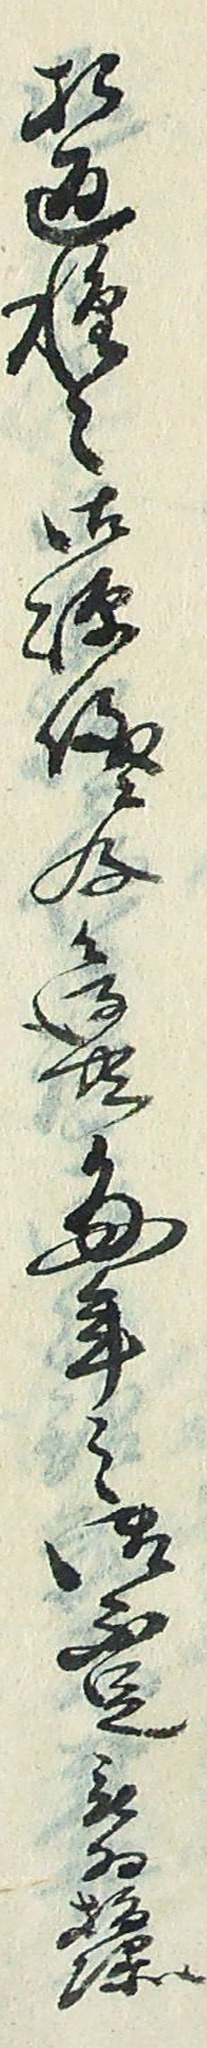折返種々御評儀ニ及候得共多年之御不足被為指添

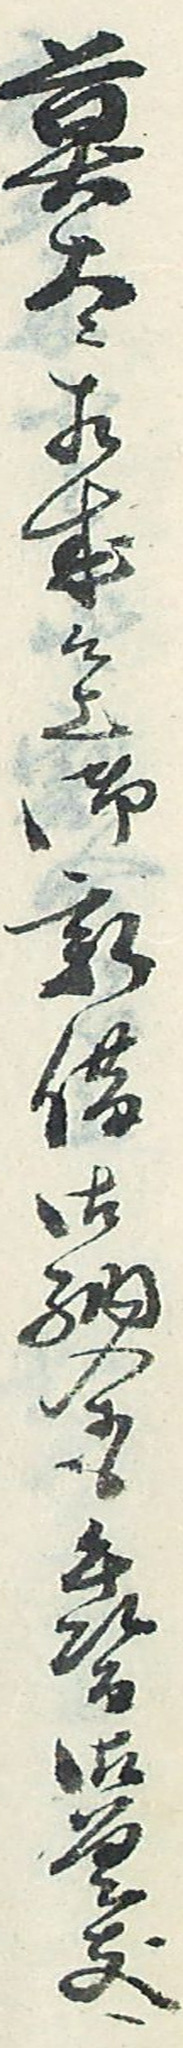莫大ニ相成候上御新借御納入等も犇と御差支へ
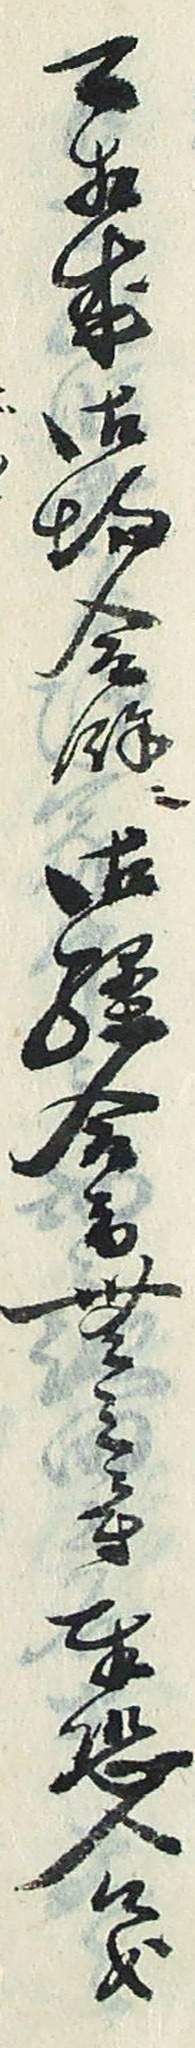可相成御場合餘ニ御繰合方無之ニ付奉恐入候義
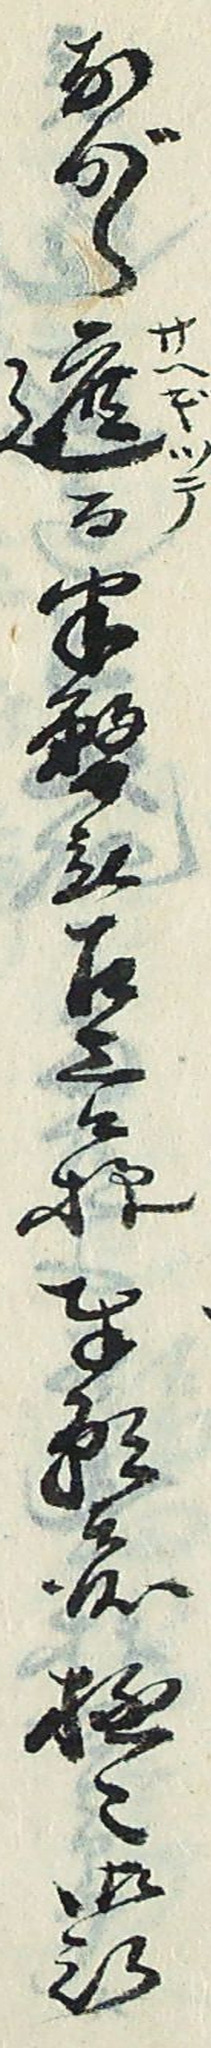ながら遮而半務被召上候様奉願候所極々御行
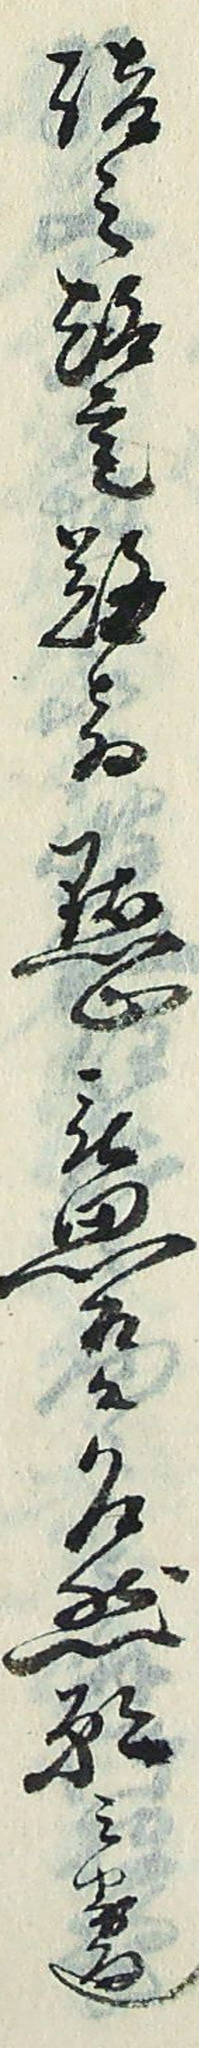詰之趣意難被為黙止被思召候乍然願之寄返
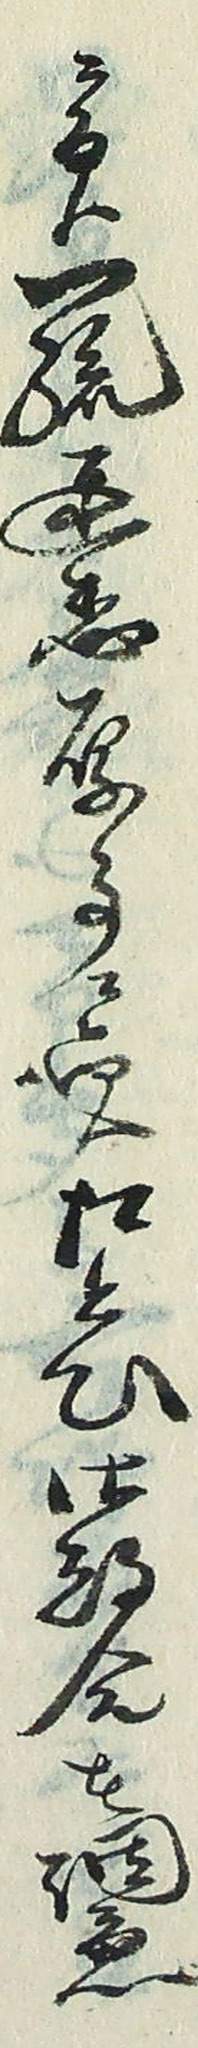ニ而ハ一統迷惑厚事ニ候得ハたとひ御都合者調兼
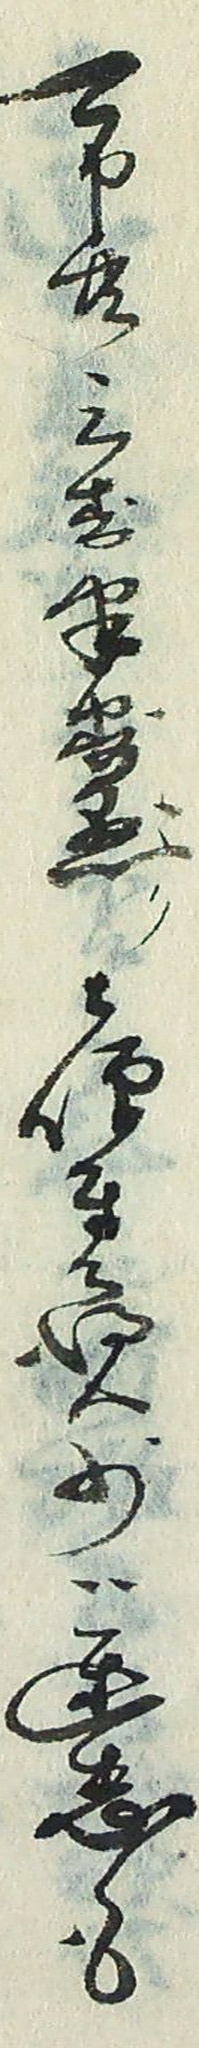可申共三歩半歩懸り被仰付候得ハ少ハ迷惑も
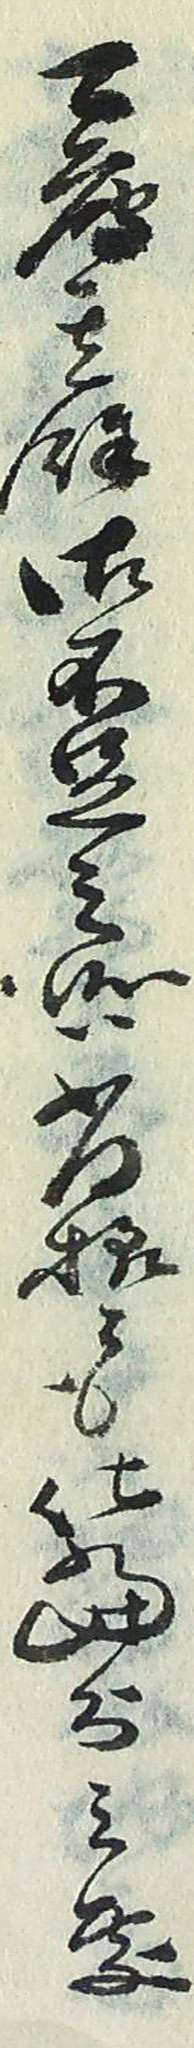可薄其餘御不足之所ハ如何様ニも仕當分之處
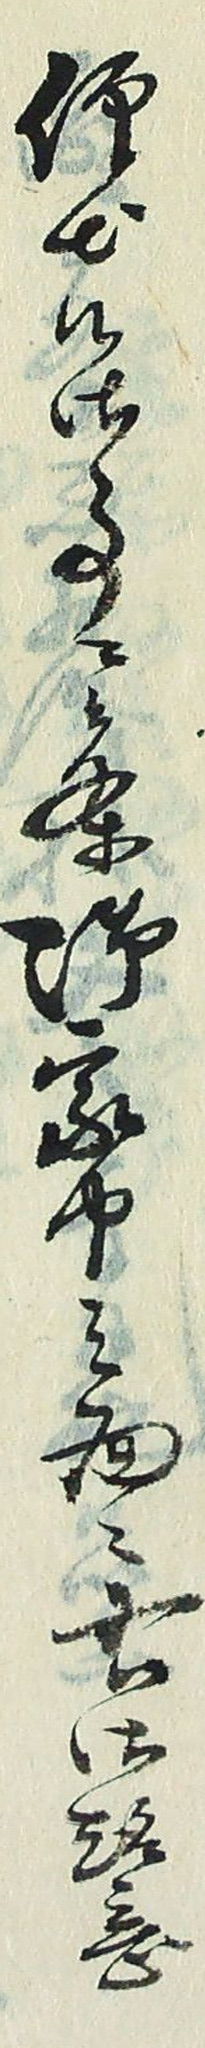仰出候御事ニ候条御家中之面々右御趣意
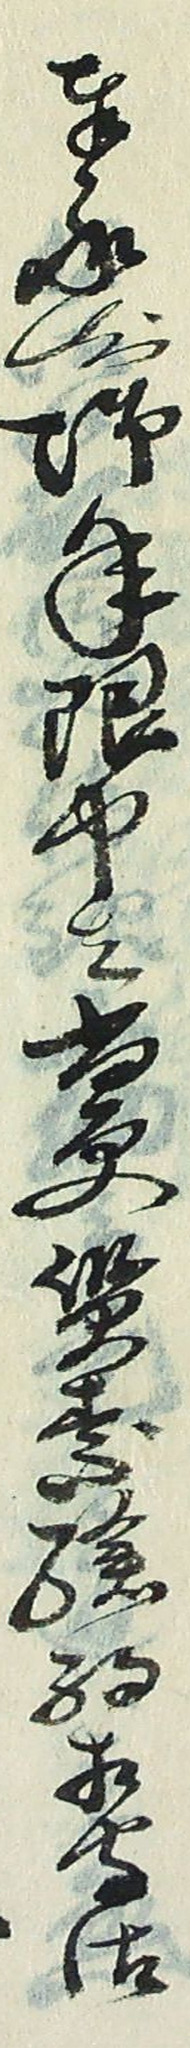奉承知御年限中者尚更質素倹約相守御
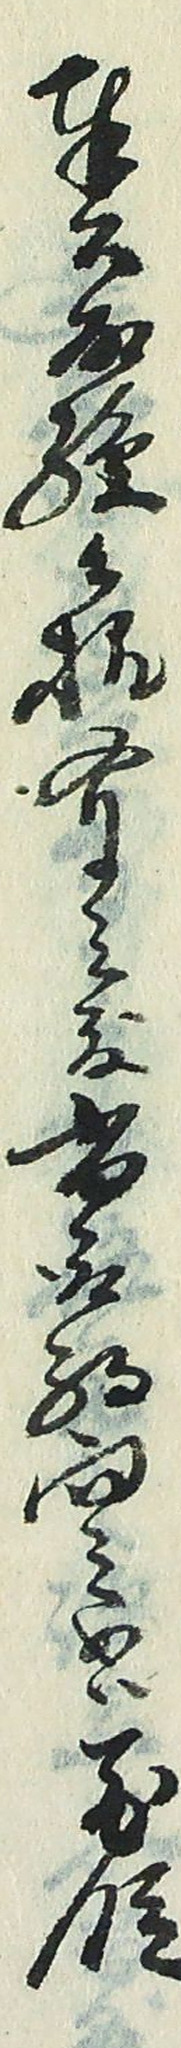奉公取續候様有之度右取約向之義ハ別段
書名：諸御趣意書并御下知向之写
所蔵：鳴門教育大学 Naruto University of Education
